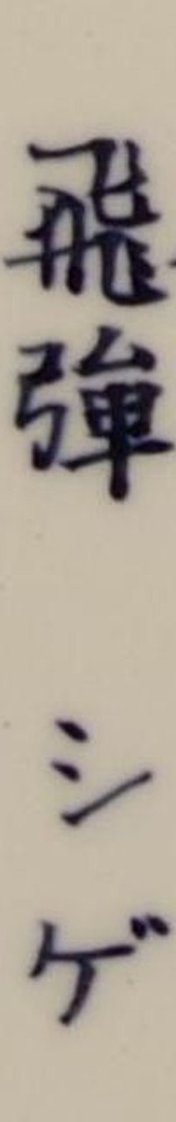飛騨シゲ
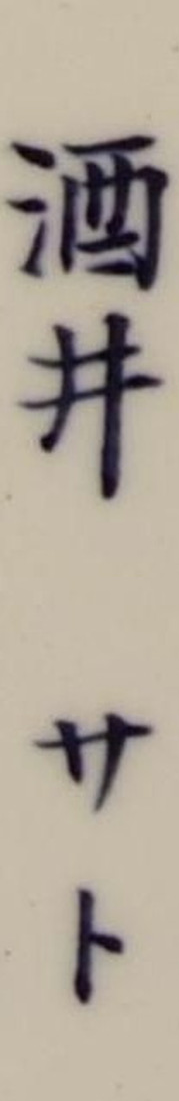酒井サト
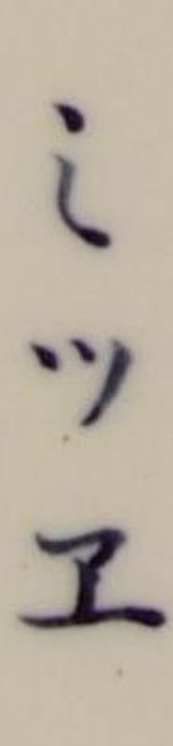シツヱ
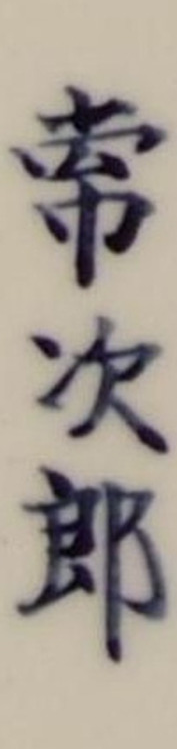常次郎
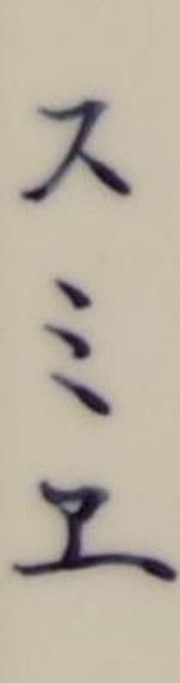スミ工

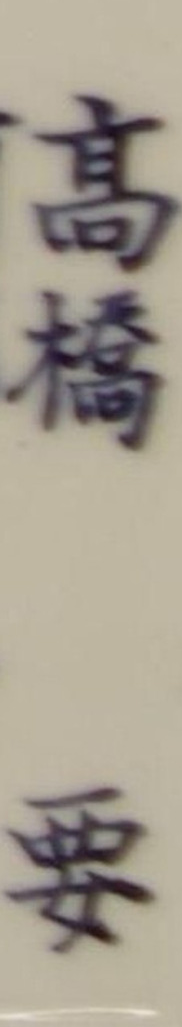高橋要
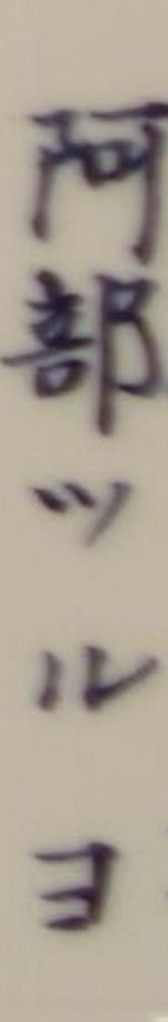阿部ツルヨ
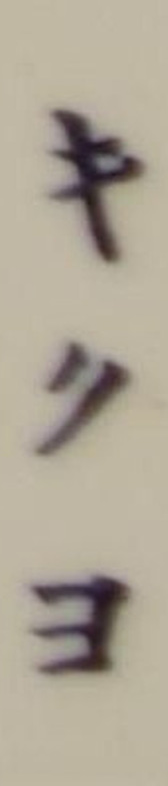キクヨ
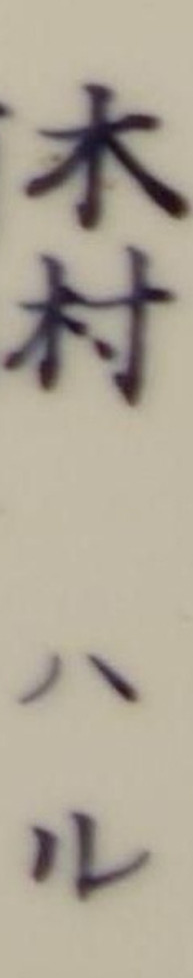木村ハル
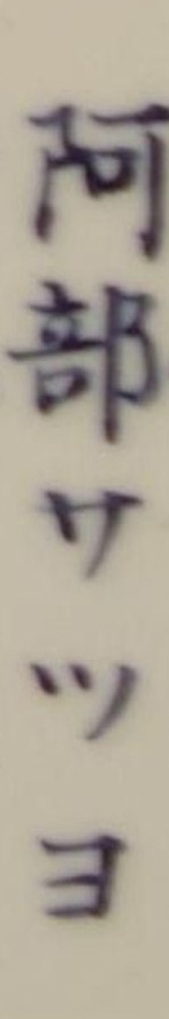阿部サツヨ
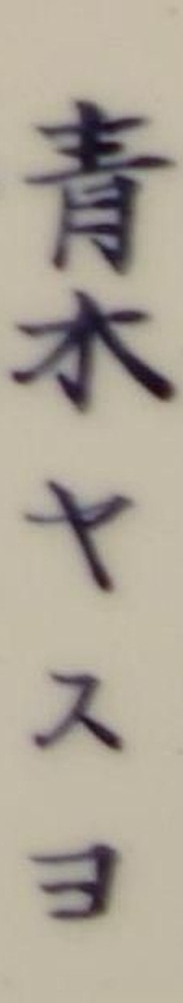青木ヤスヨ
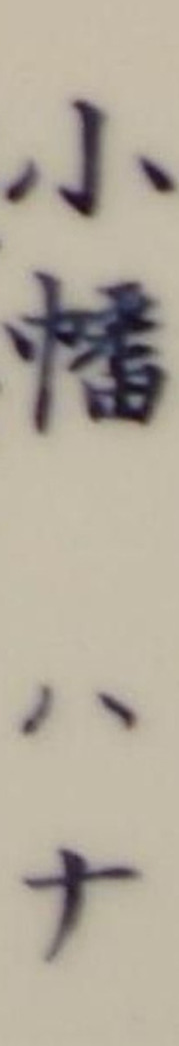小幡ハナ
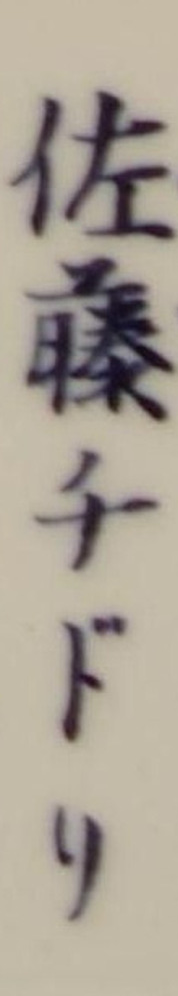佐藤チドリ
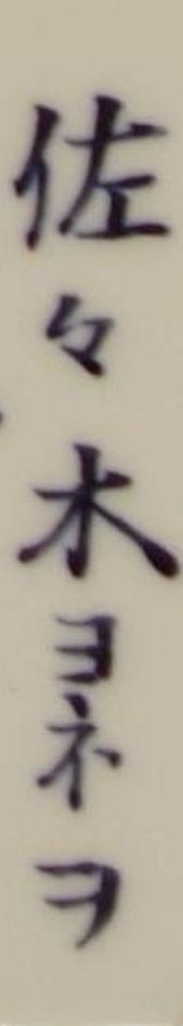佐々木ヨネヲ
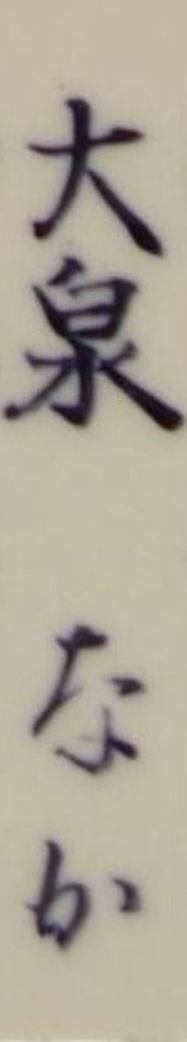大泉なか
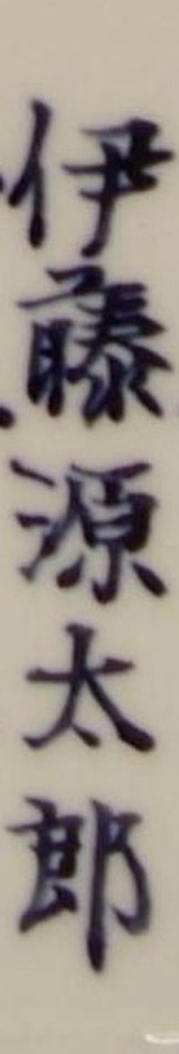伊藤源太郎
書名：M~S
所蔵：高野山金剛峯寺
